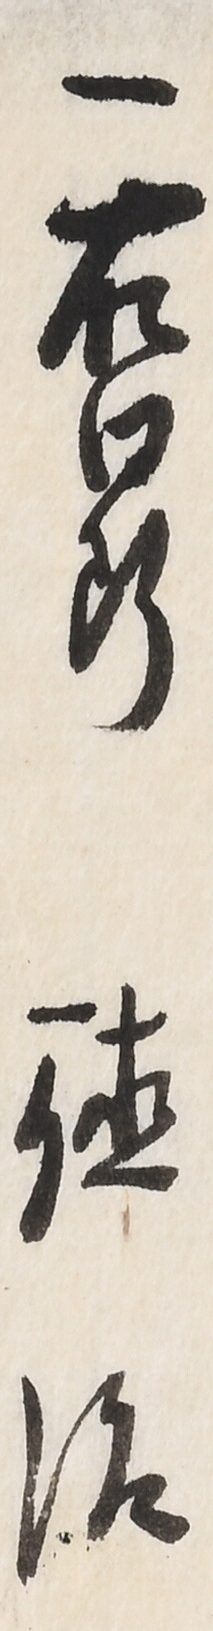一右同断徳治
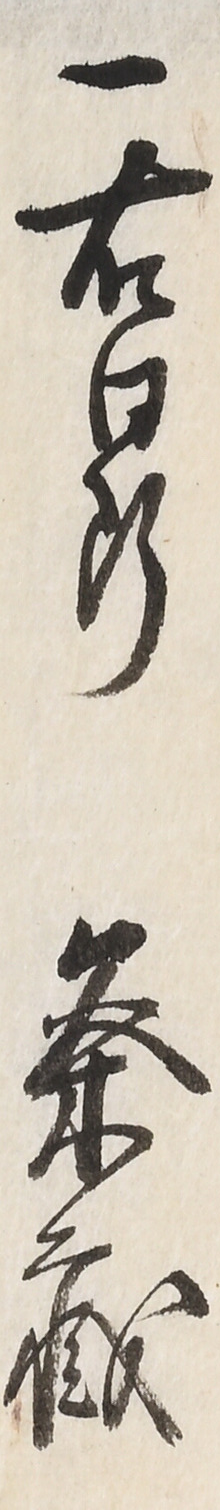一右同断粂蔵
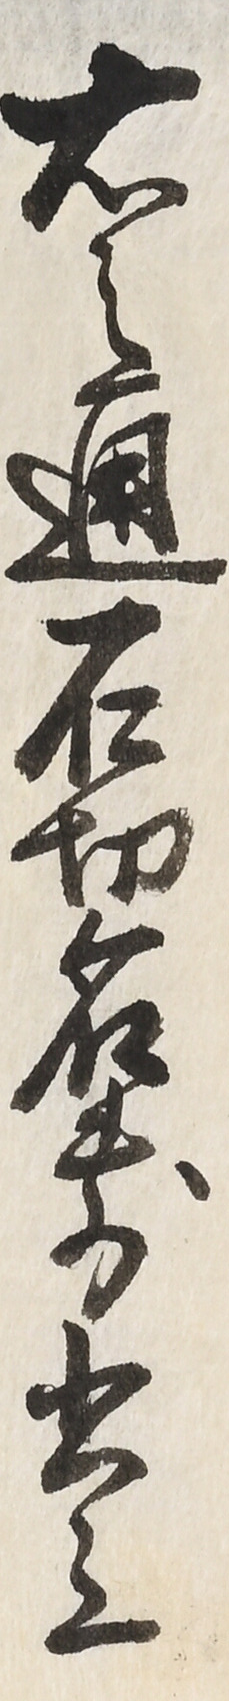右之通石切名前書上
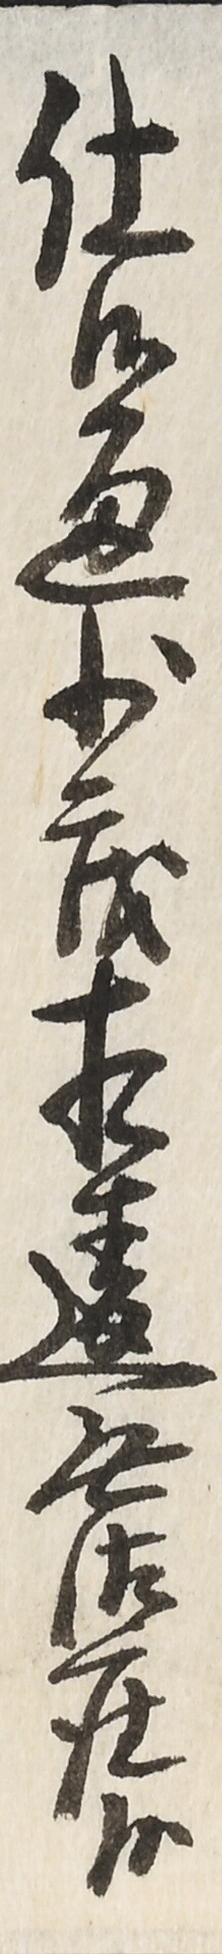仕候通少茂相違無御座候
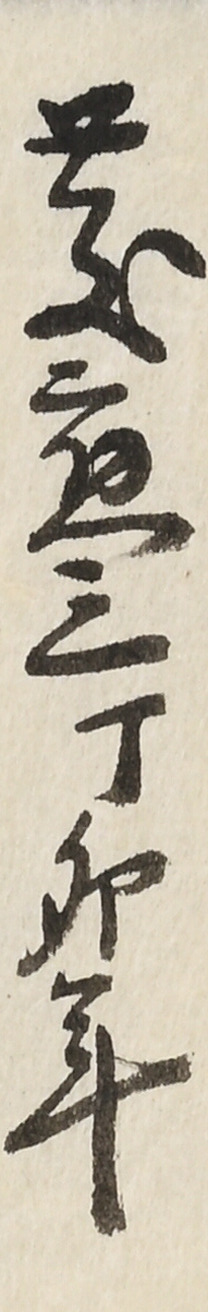慶應三丁卯年

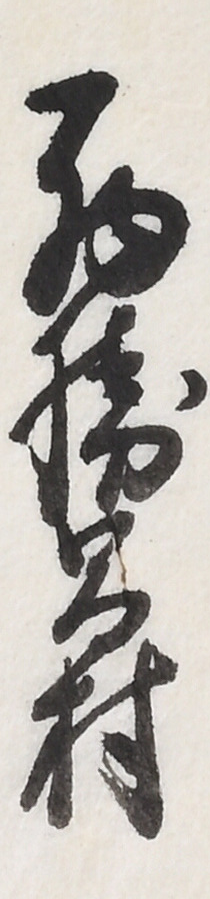西勝間村
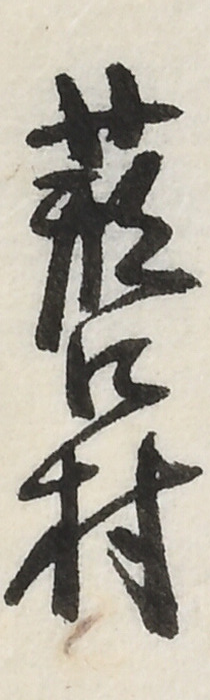荊口村
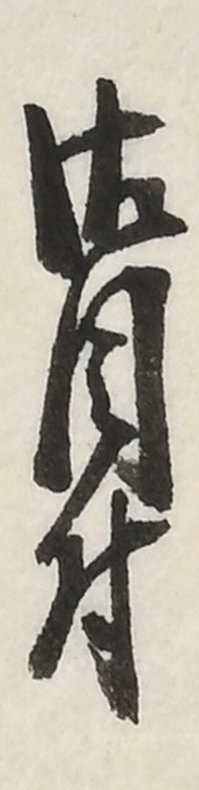御目付
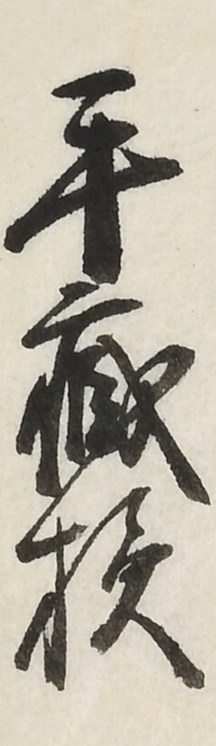平蔵様
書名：慶應三丁卯年四月石切名前書上帳
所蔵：伊那市立高遠町図書館・合同会社AMANE
